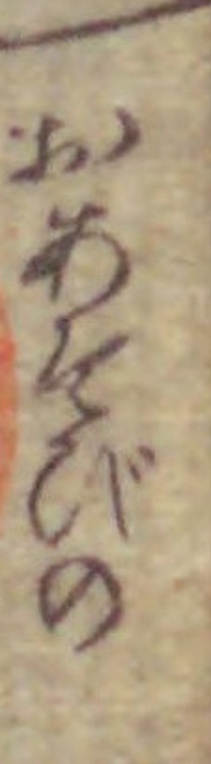おあそびの
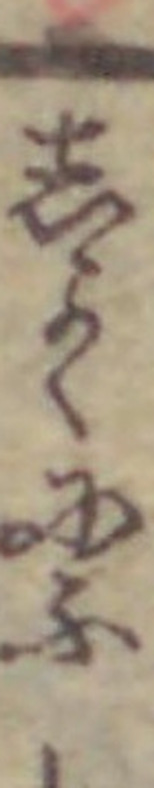しよくにふ
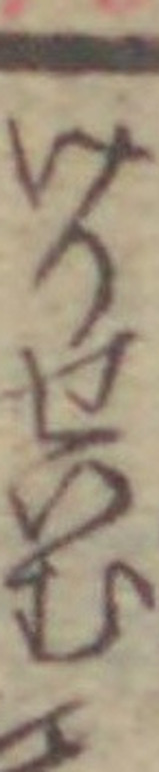けりせいむ
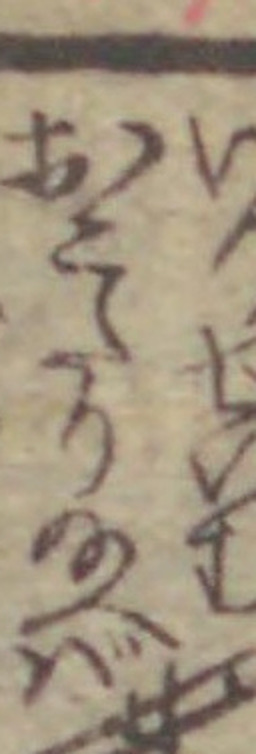おこたり給へば
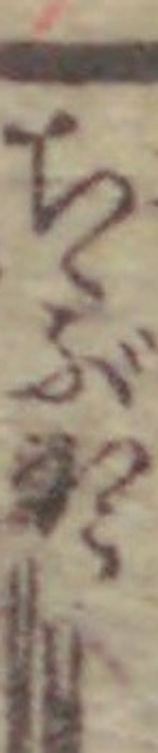ちゝぶほう
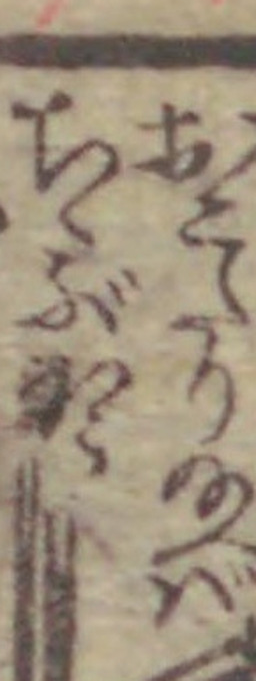ちゝぶほう
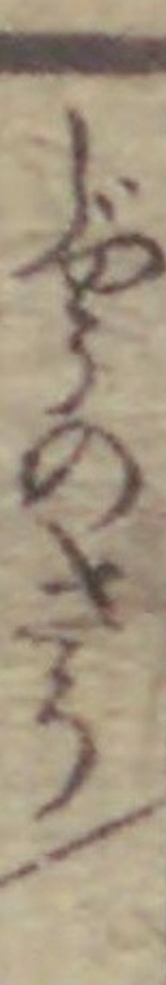じやうのきう
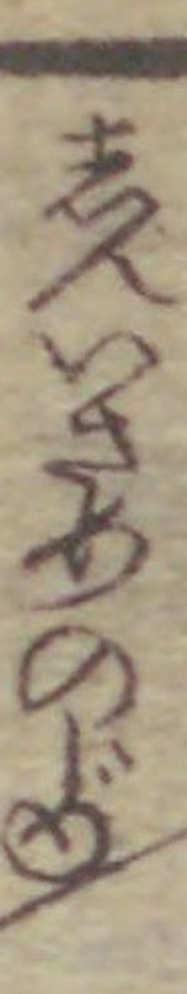しんいさめのじゆ
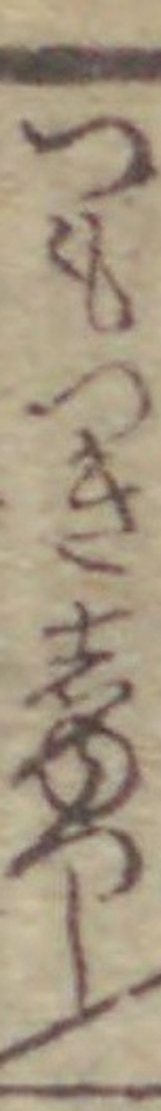つもつきしゆつし
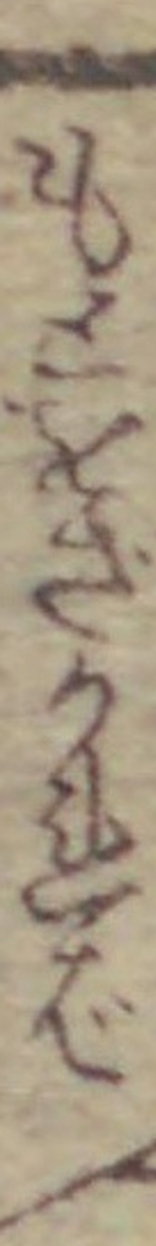もとをざかれば
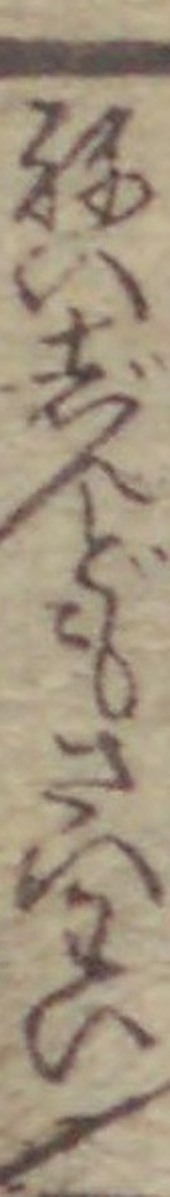ねいじんどもさいわい
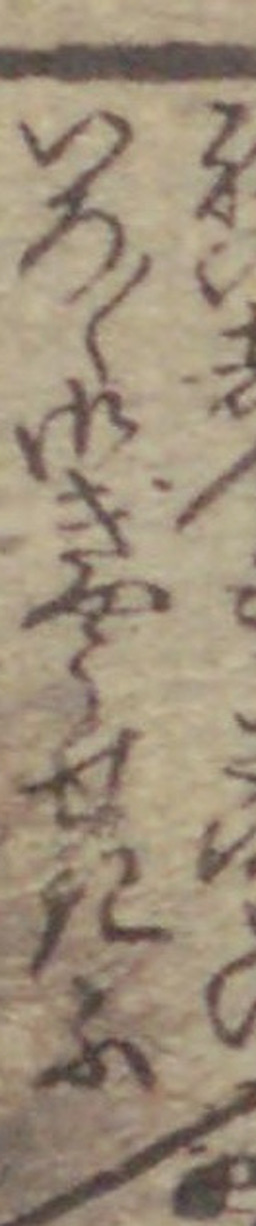いろ〳〵御きやうせきふ
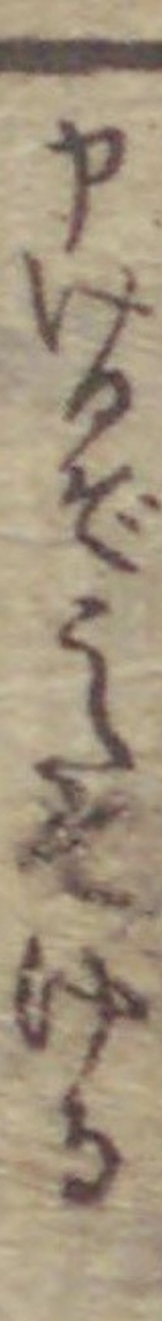申けるぞこたえける
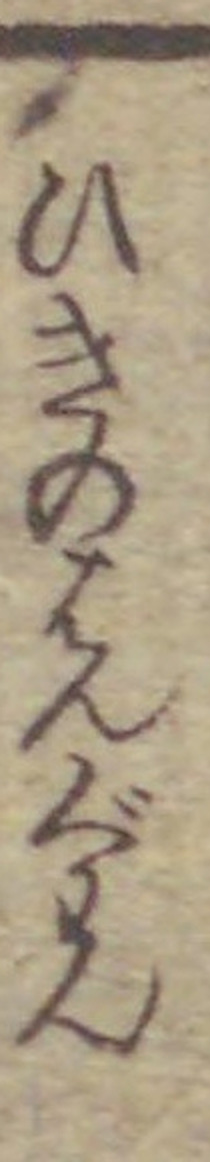ひきのはんぐわん
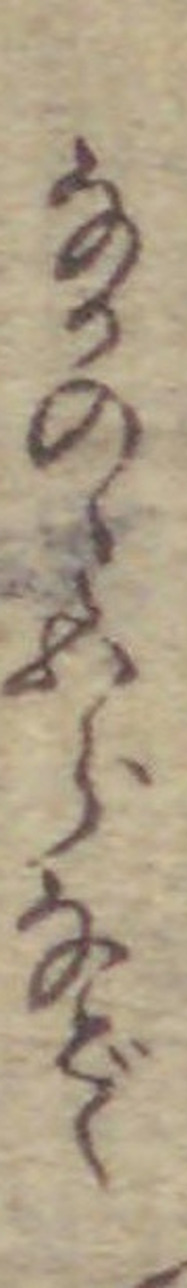なかのゝ五郎などゝ
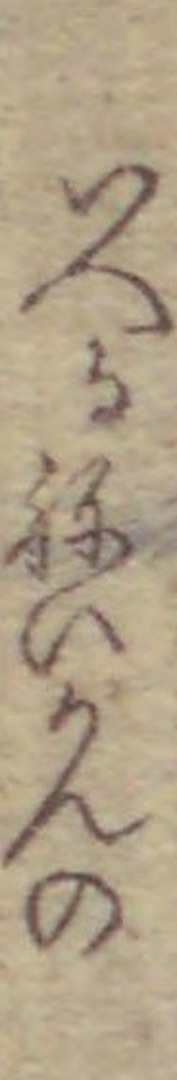いへるねいかんの
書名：鎌倉山紅葉浮名
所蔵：国立国会図書館 National Diet Library, JAPAN
